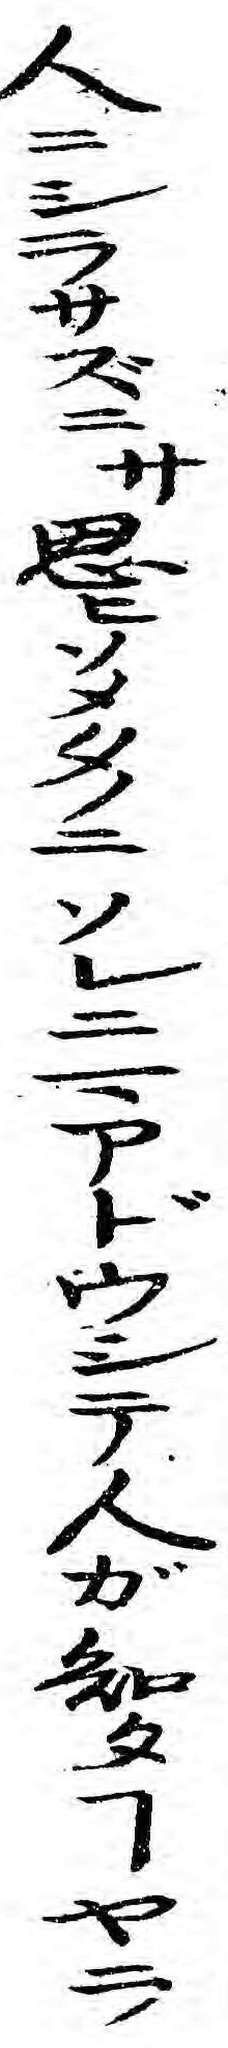人ニシラサズニ思ヒソメタノニソレニマアドウシテ人ガ知タコトヤラ
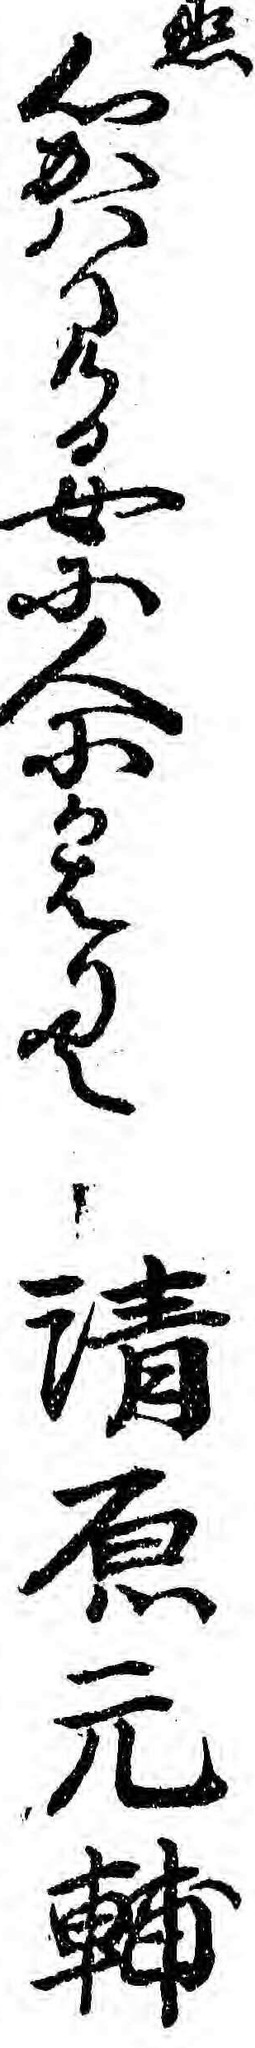後拾遺集恋心かはりける女に人にかはりて清原元輔
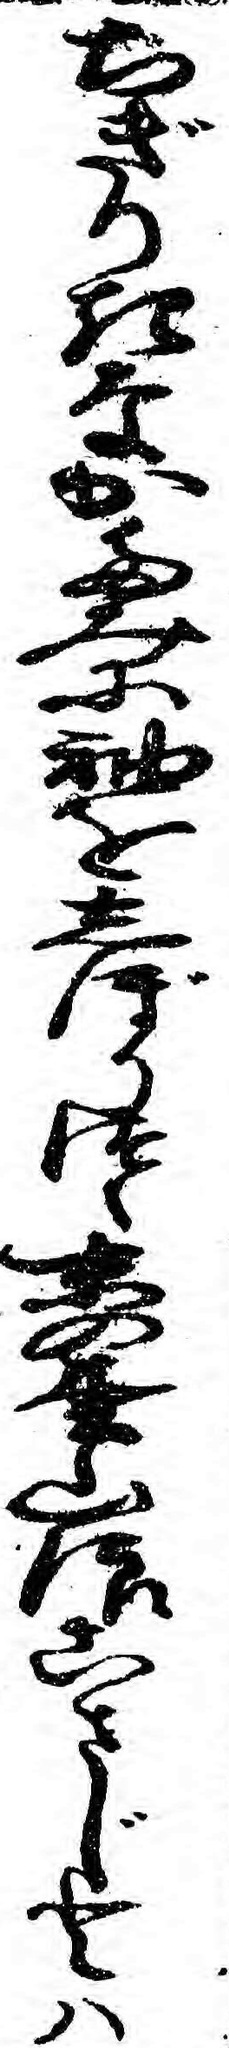ちぎりきなかたみに袖をしぼりつゝ末の松山浪こさじとは
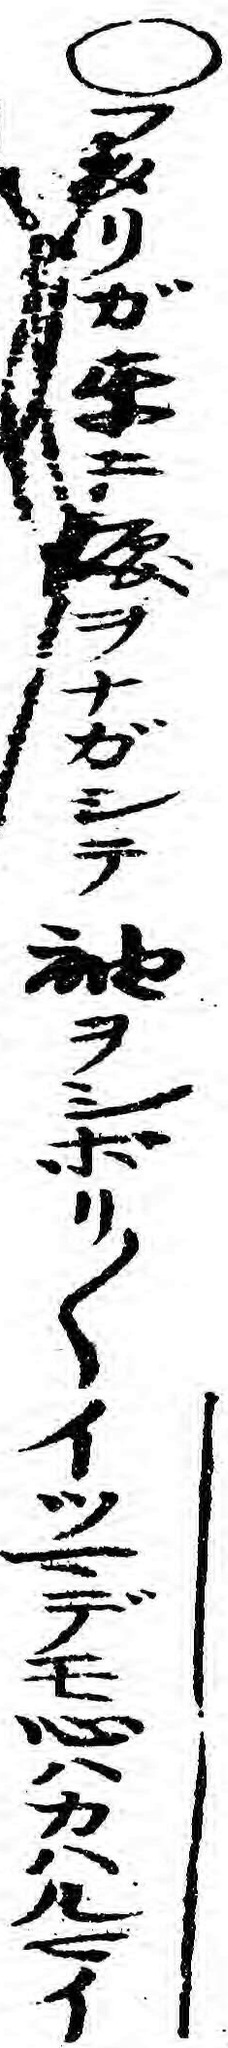○フタリガ互ニ涙ヲナガシテ袖ヲシボリ〳〵イツマデモ心ハカハルマイ
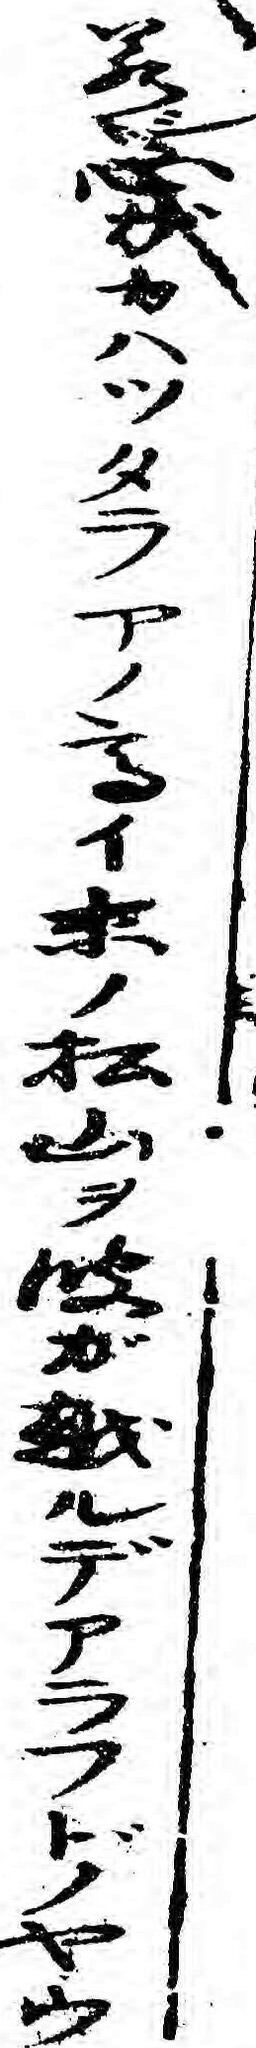若シ心ガカハツタラアノ高イ末ノ松山ヲ波ガ越ルデアラフドノヤウ
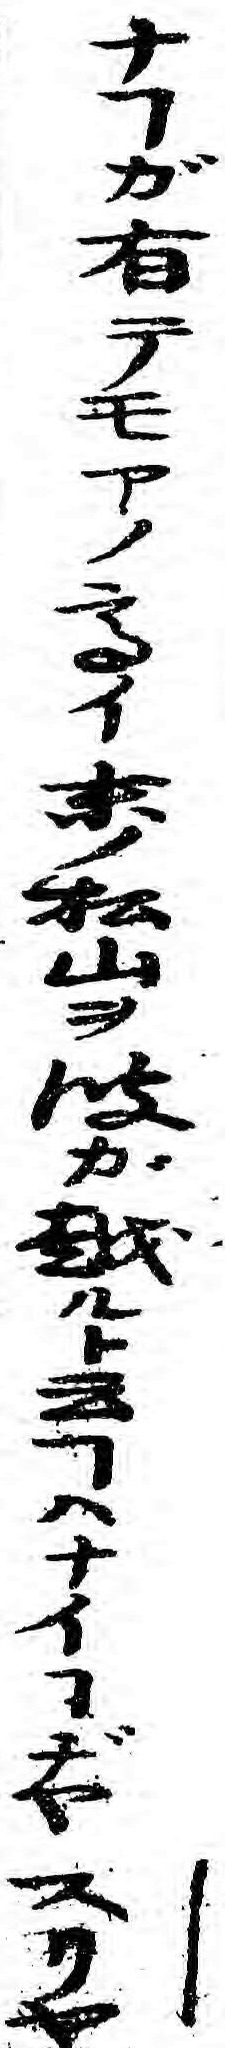ナコトガ有テモアノ高イ末ノ松山ヲ波ガ越ルト云コトハナイコトヂヤスリヤ
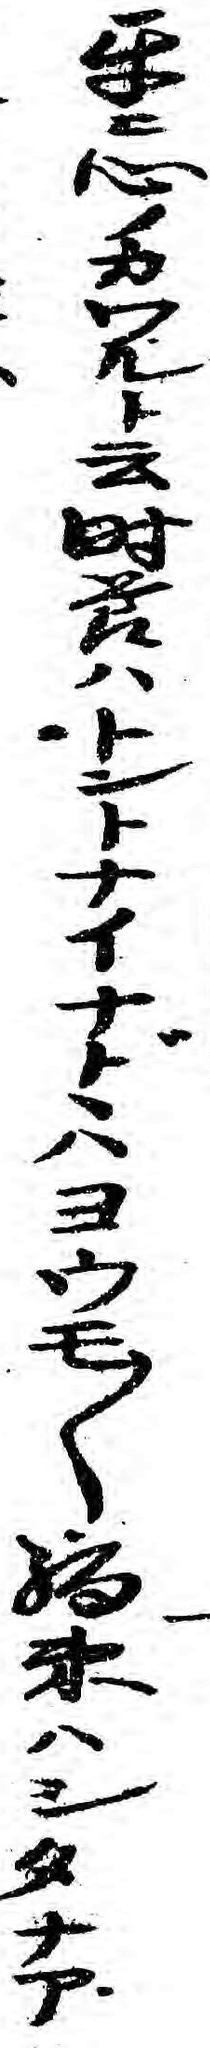互ニ心ノカワルト云時節ハトントナイナドヽハヨウモ〳〵約束ハシタナア
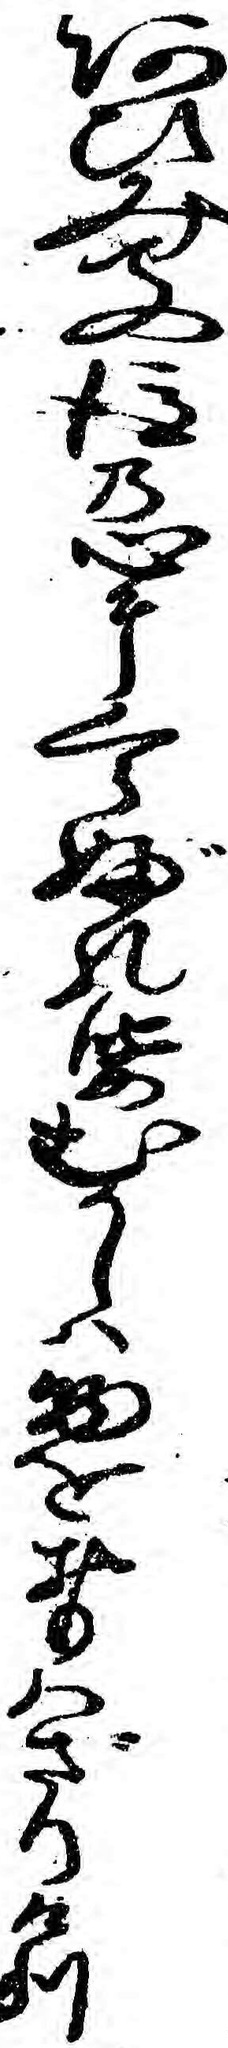あひみての後の心にくらぶればむかしは物をおもはざりけり
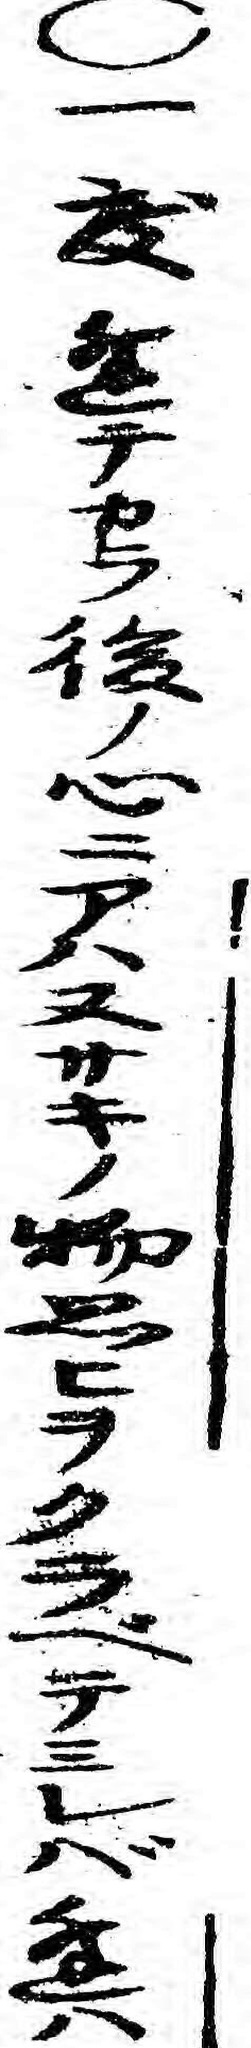○一度逢テカラ後ノ心ニアハヌサキノ物思ヒヲクラベテミレバ逢ハ
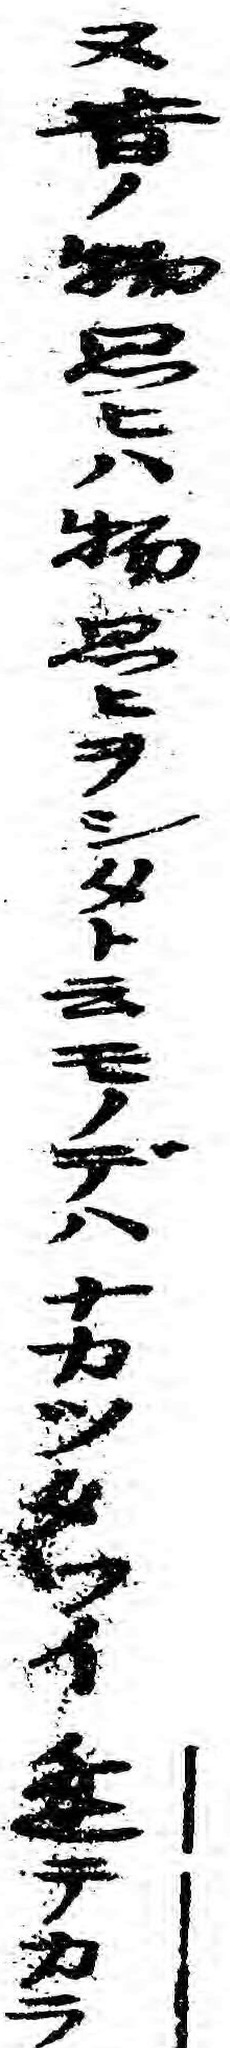ヌ昔ノ物思ヒハ物思ヒヲシタト云モノデハナカツタワイ逢テカラ
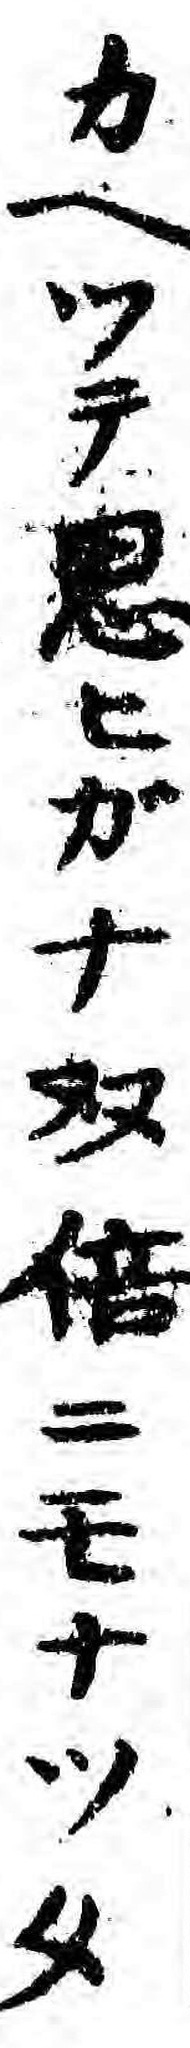カヘツテ思ヒガナ双倍ニモナツタ

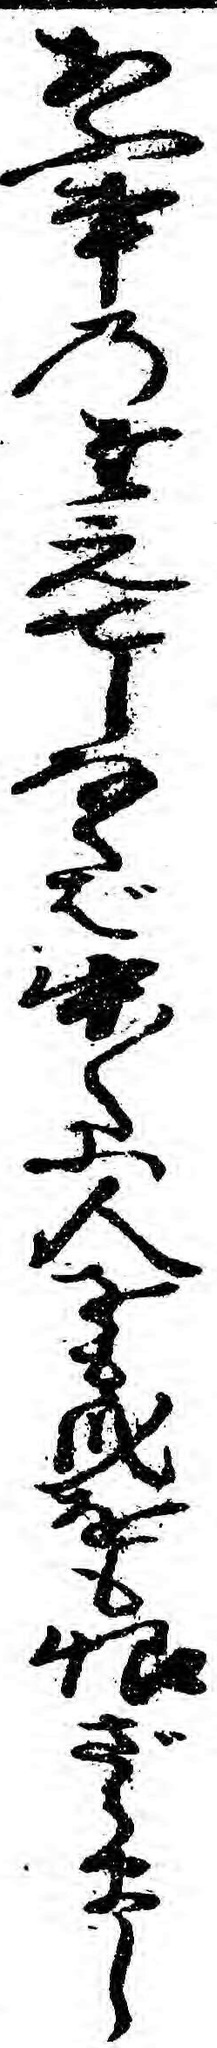あふ事のたえてしなくば中々に人をも身をも恨ざらまし
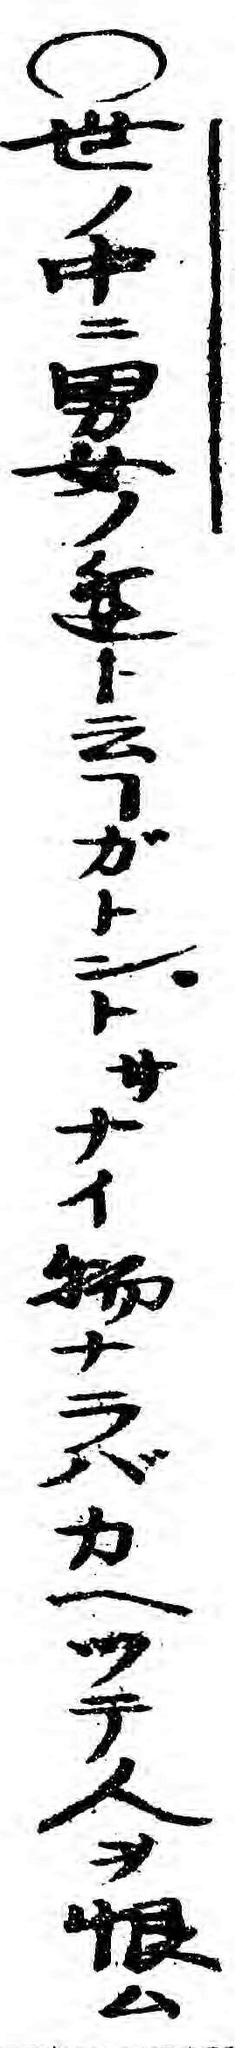○世ノ中ニ男女ノ逢ト云コトガトントナイ物ナラバカヘツテ人ヲ恨ム
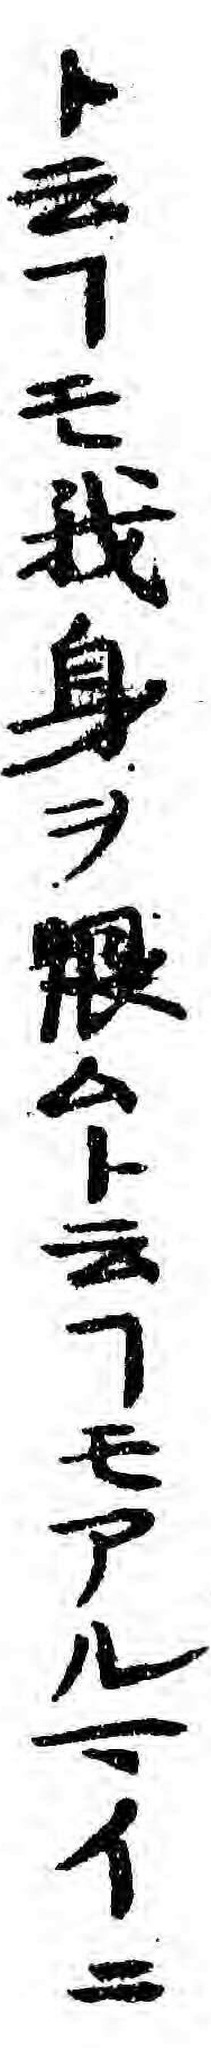ト云コトモ我身ヲ恨ムト云コトモアルマイニ
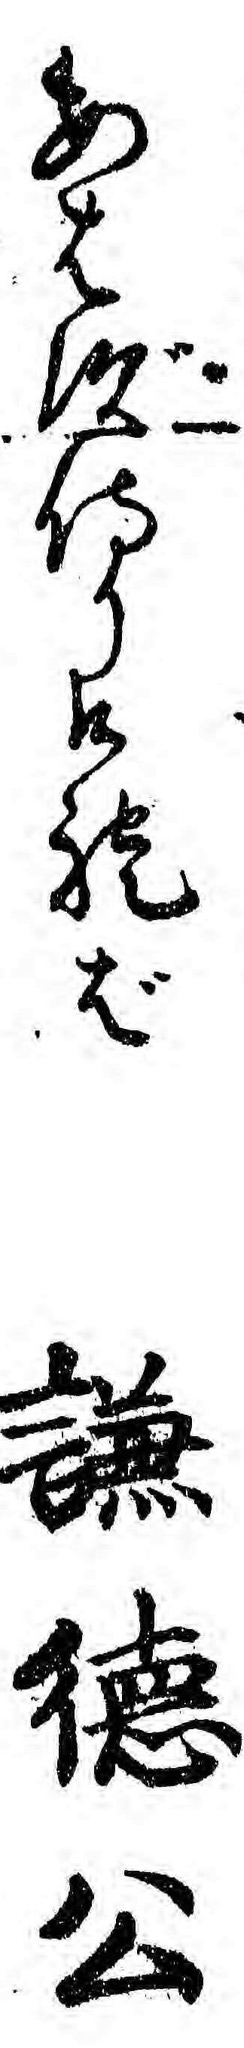あはず侍りければ謙徳公
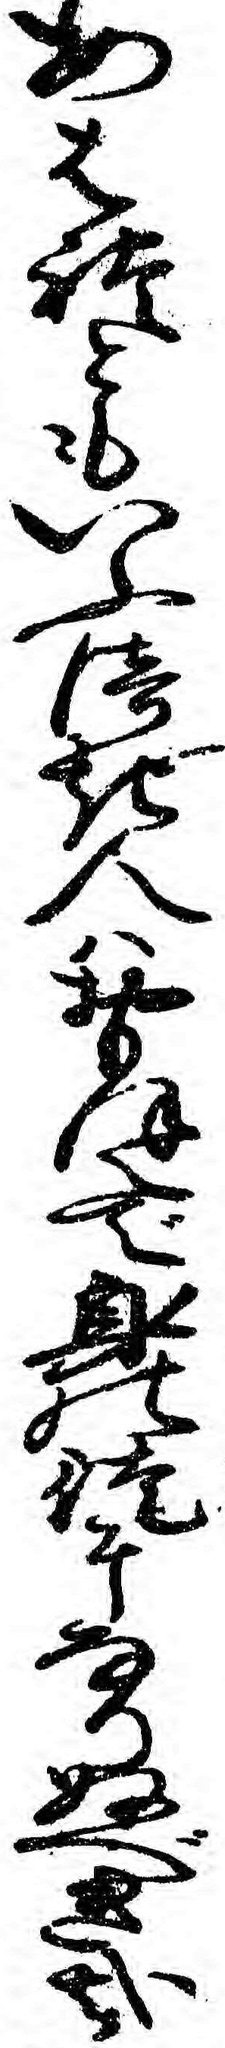あはれともいふべき人はおもほえで身の徒になりぬべき哉
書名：百人一首／小倉の山ふみ
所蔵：国文学研究資料館
